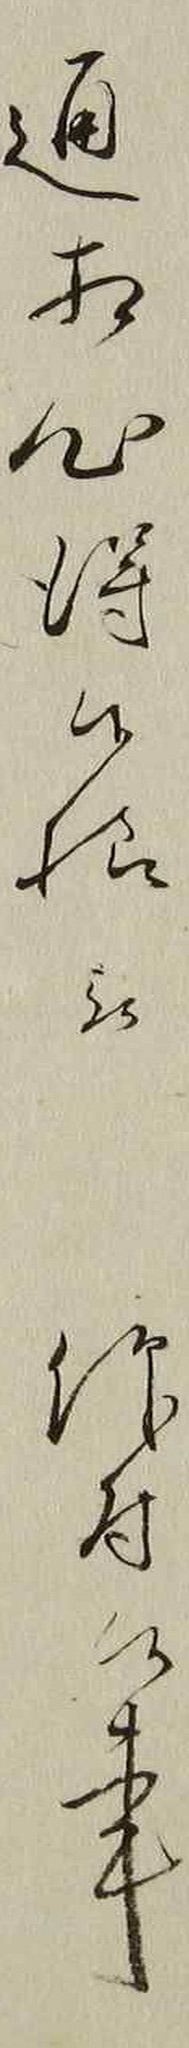通相心得候様被仰付候事
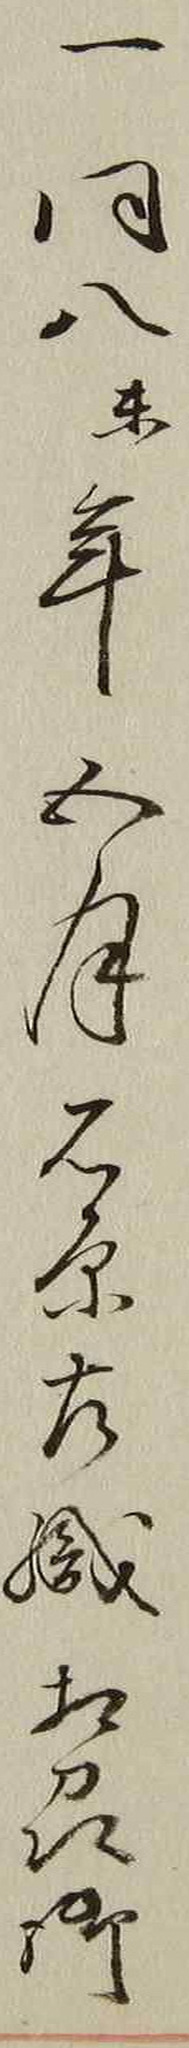一同八未年五月石原左織相州御
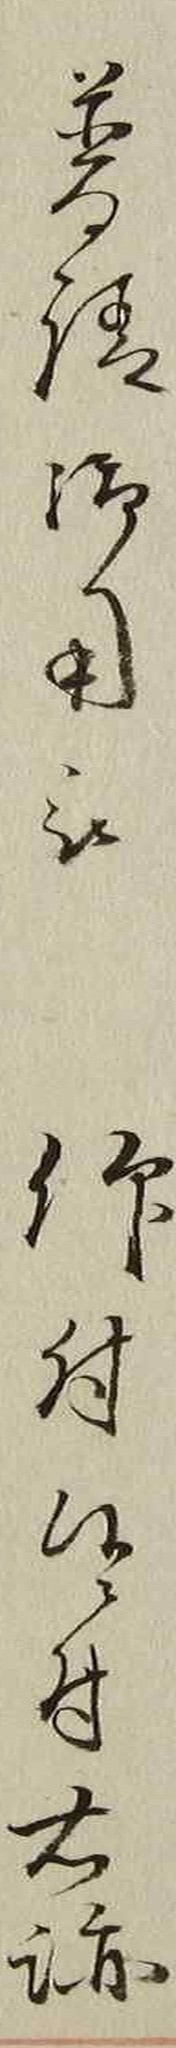普請御用被仰付候ニ付右跡
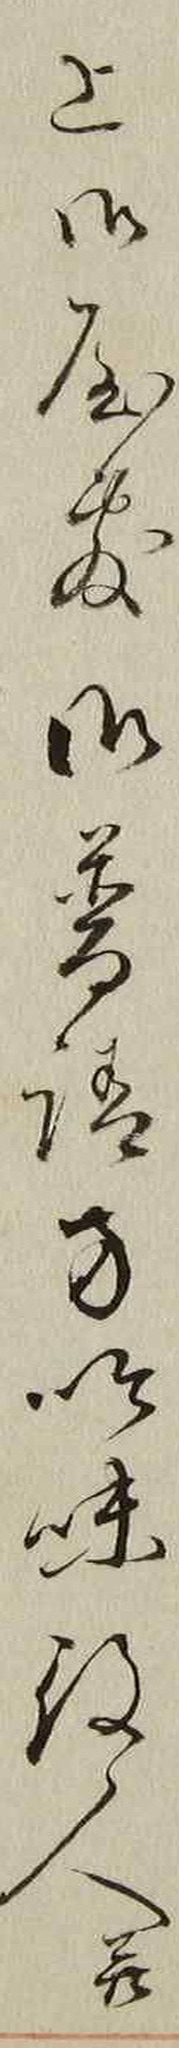上御屋敷御普請方吟味役人并
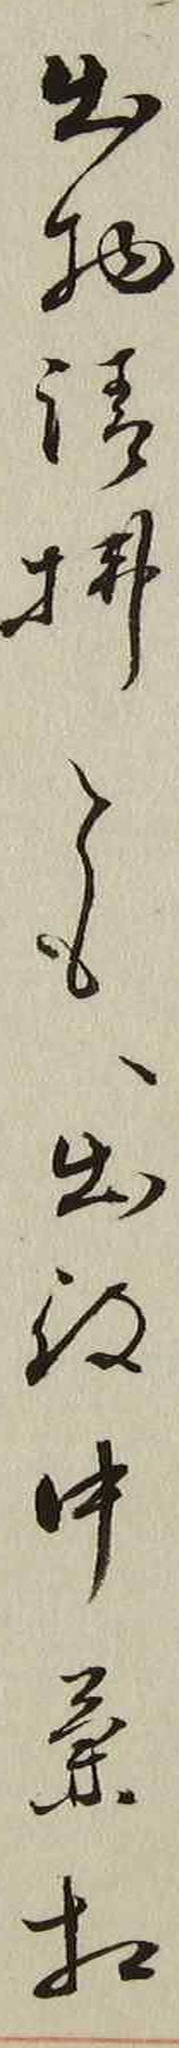書物請払ともへ出役中兼相
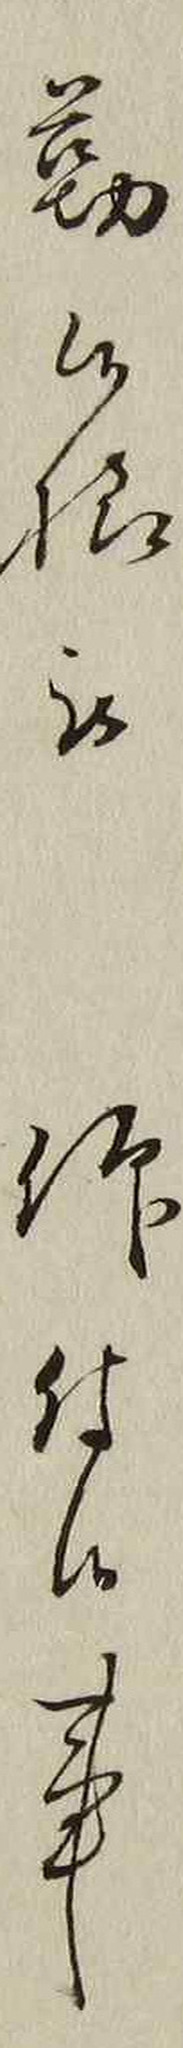勤候様被仰付候事
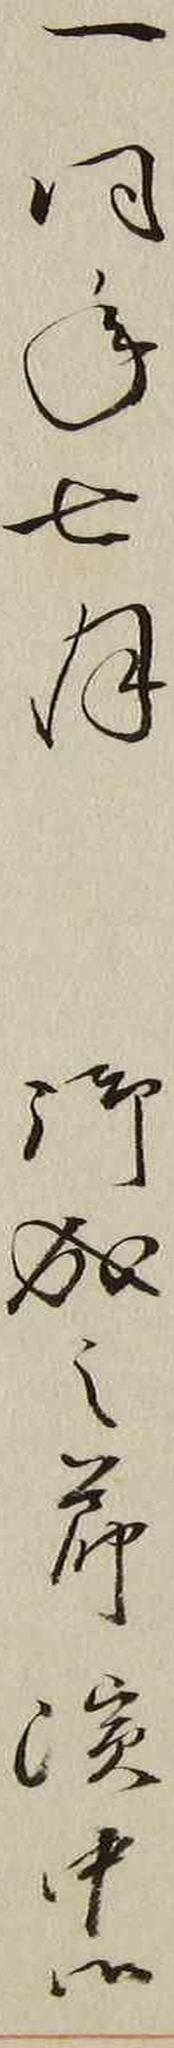一同年七月御成之節浜中御
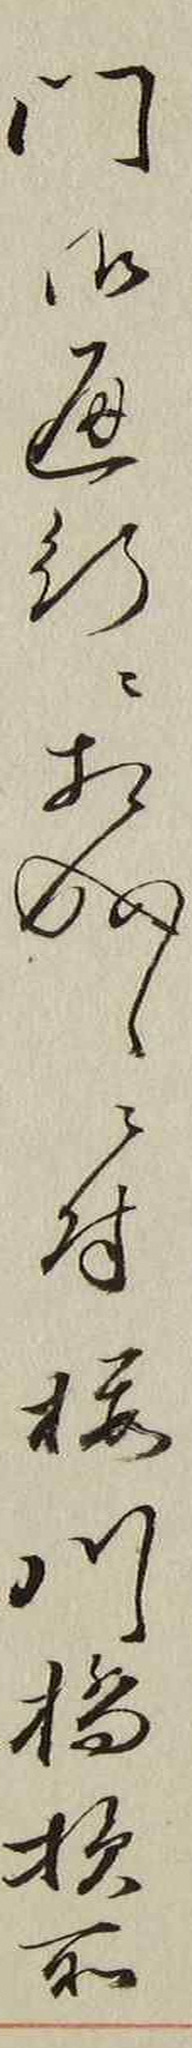門御通行ニ相成候ニ付桜川橋損所
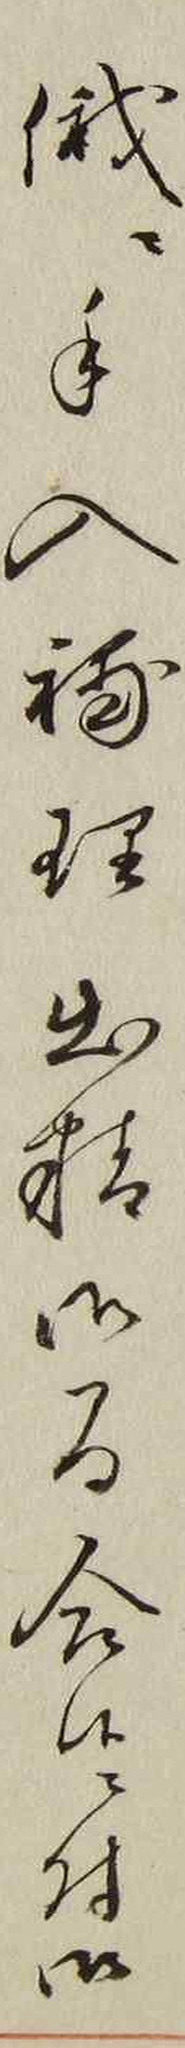俄ニ手入補理出精御間合候ニ付御
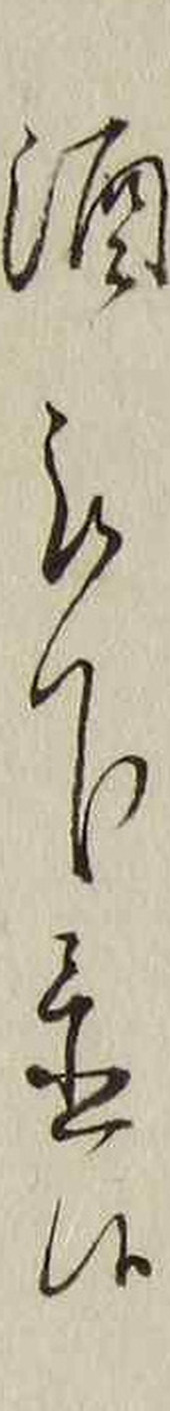酒被下置候
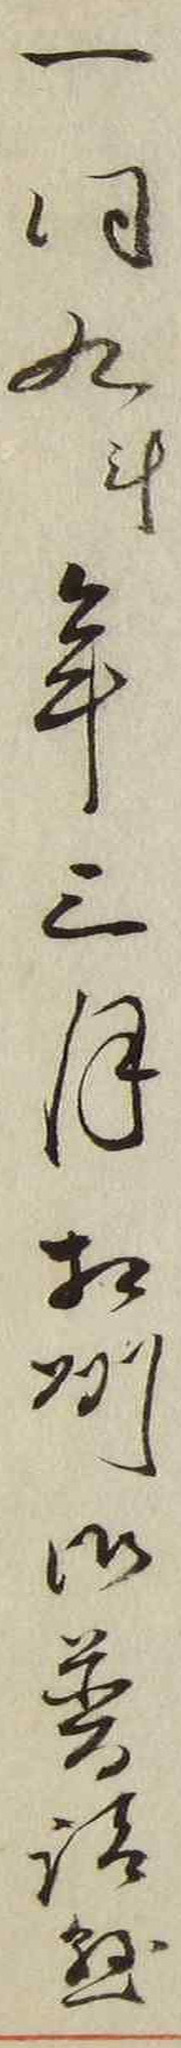一同九申年三月相州御普請懸

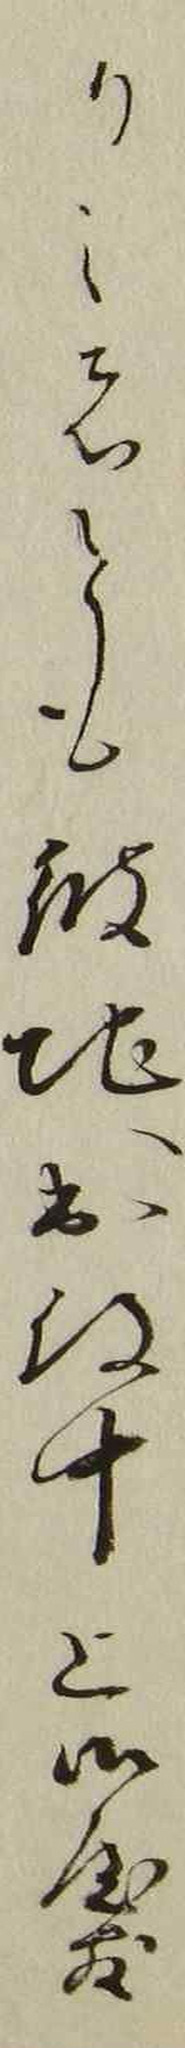り之者とも彼地へ出役中上御屋敷
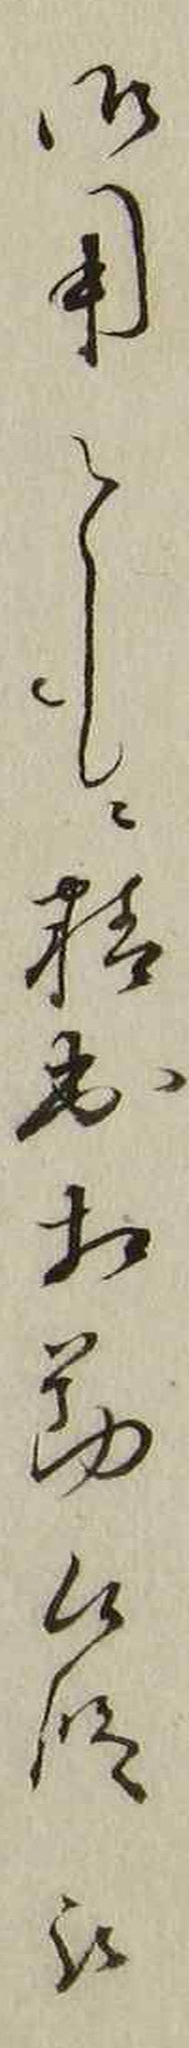御用ともニ精出相勤候段被
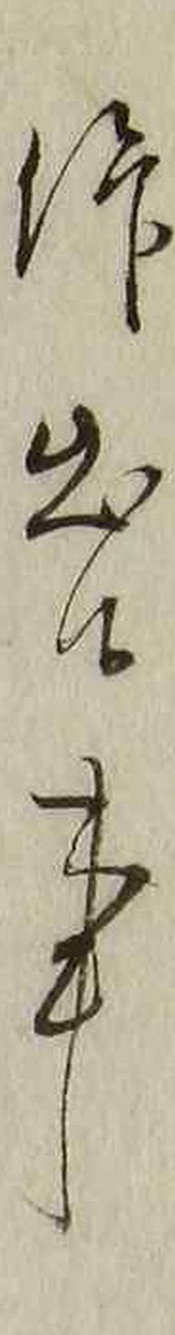仰出候事
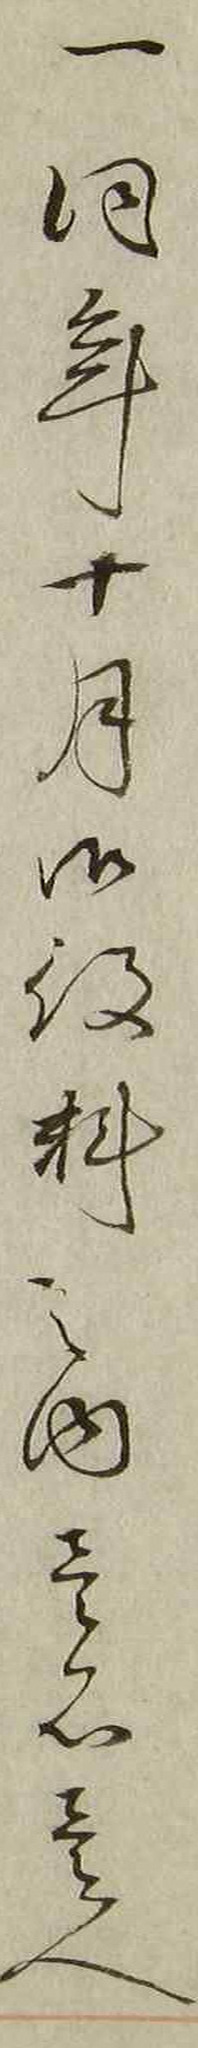一同年十月御役料之内壱石壱人
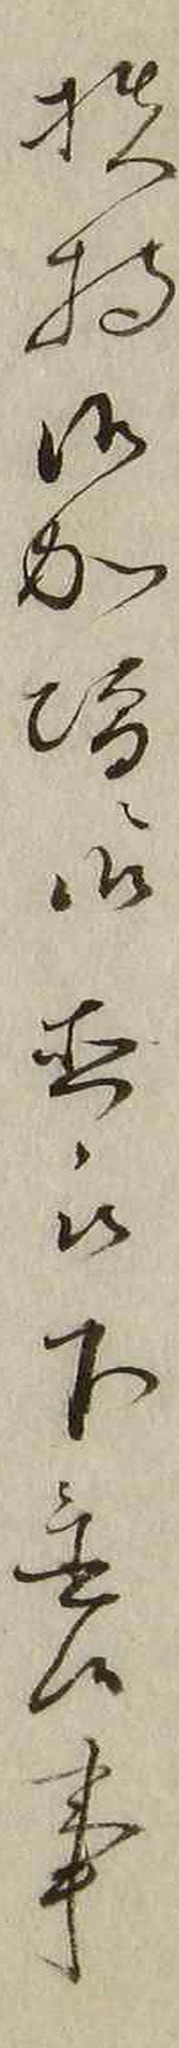扶持御加増ニ御直被下置候事
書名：諸士系譜　巻之8　い之部8
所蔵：会津若松市立会津図書館
